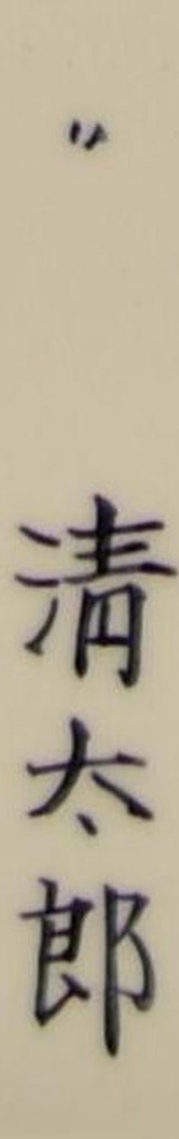清太郎
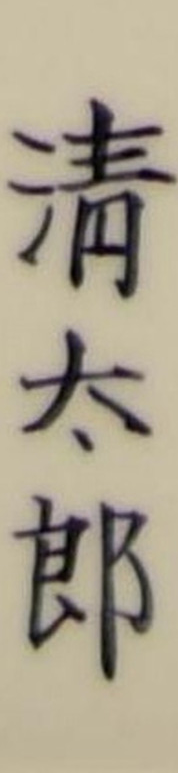清太郎
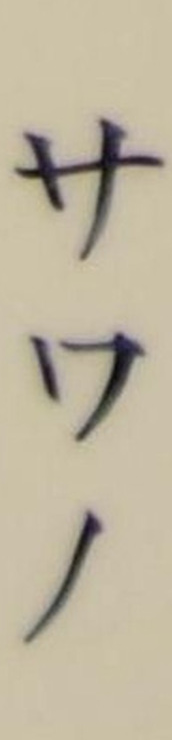サワノ
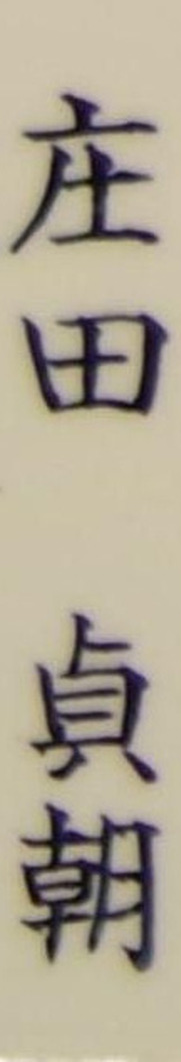庄田貞朝
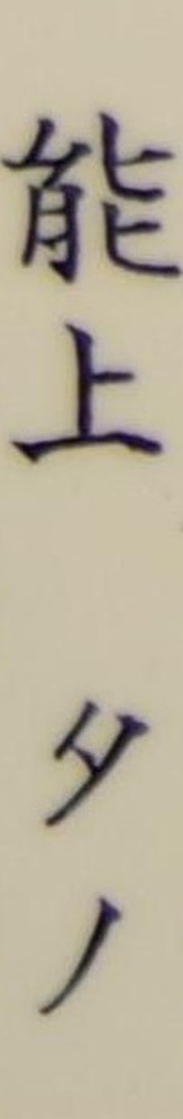能上タノ
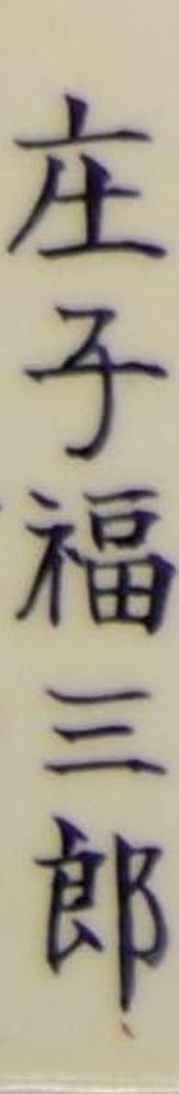庄子福三郎
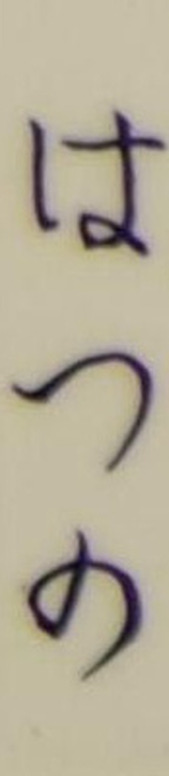はつの

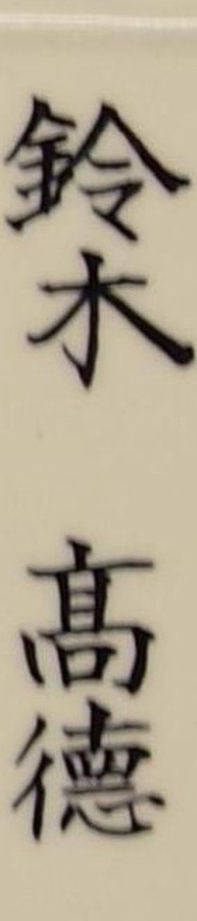鈴木高徳
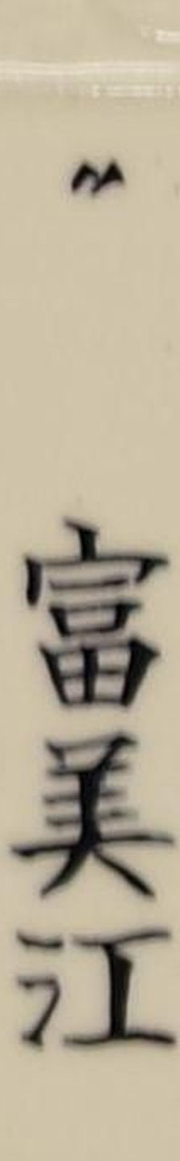富美江
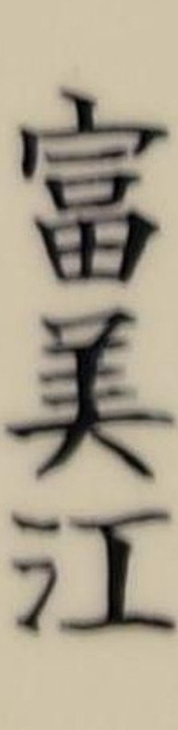富美江
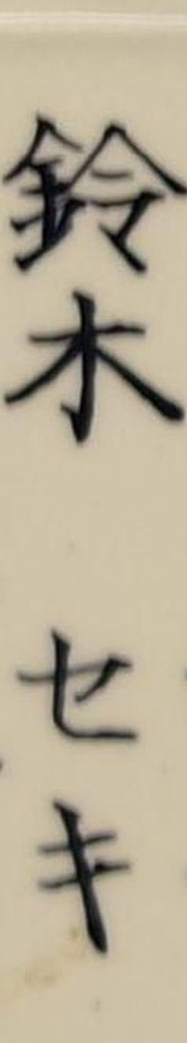鈴木セキ
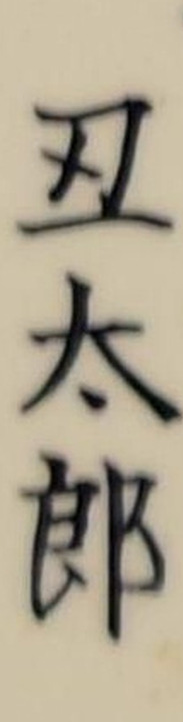丑太郎
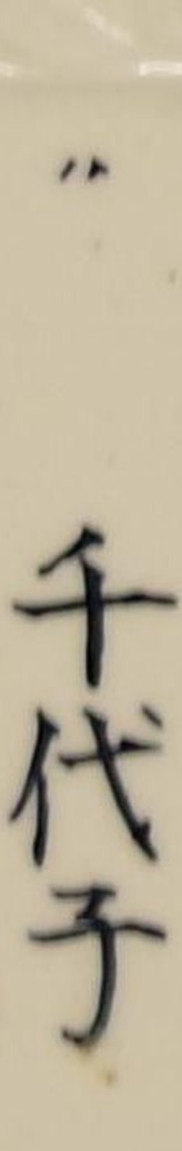千代子
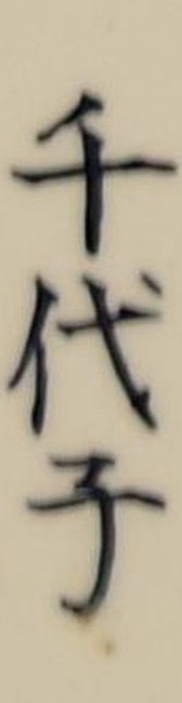千代子
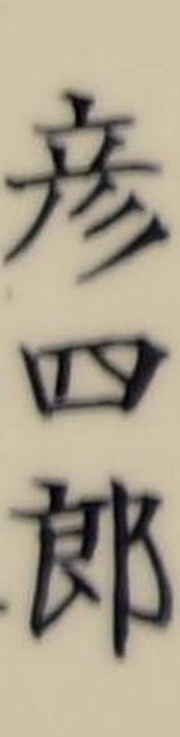彦四郎
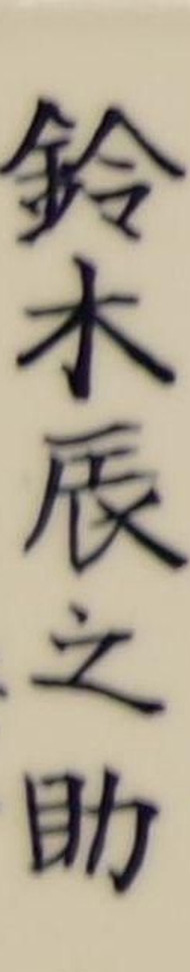鈴木辰之助
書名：A~D
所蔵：koyasan kongobuji
